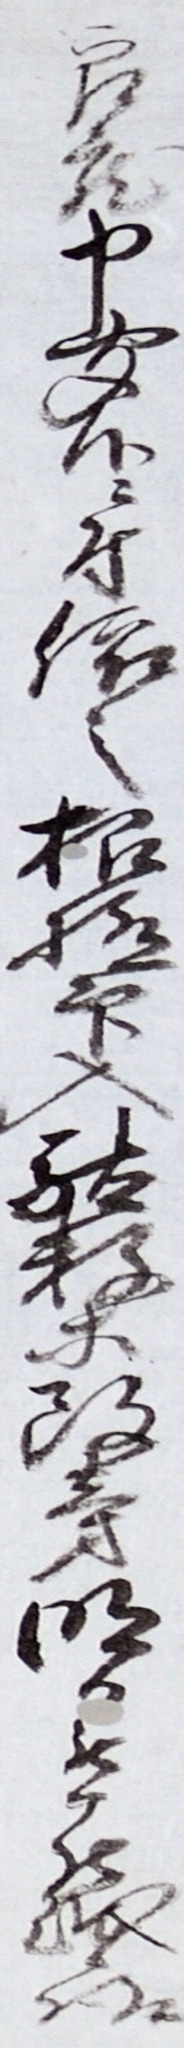良蔵申聞候ニ付依之根極印入駄数等改旁明日被罷越候様
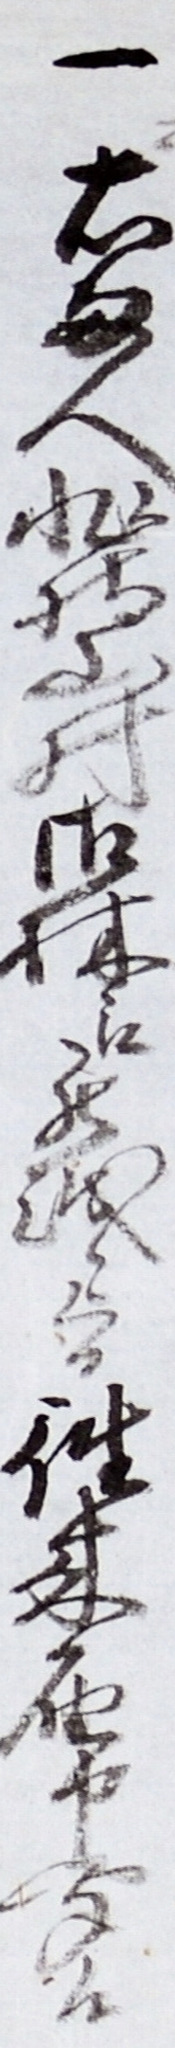一右両人非持山村御林江罷越候間往来届申聞候
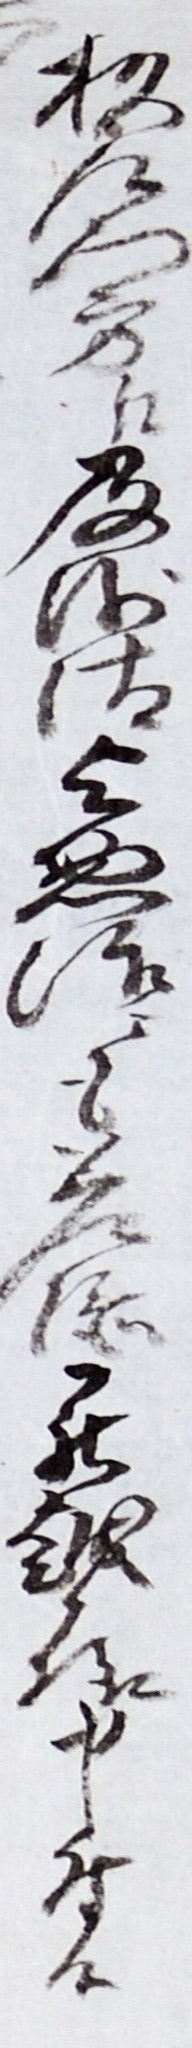杉左衛門方江及沙汰与惣治ニも差添罷越候様申付候
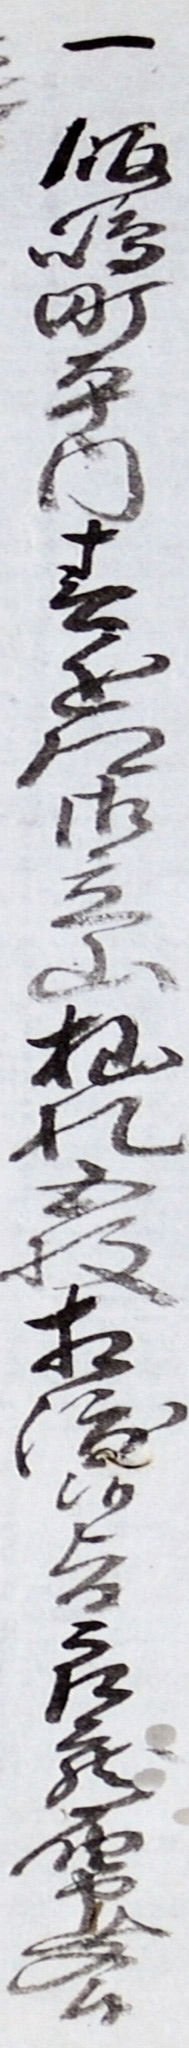一飯嶋町平内春近郷御立山杣札五枚相渡候旨良蔵届申聞候
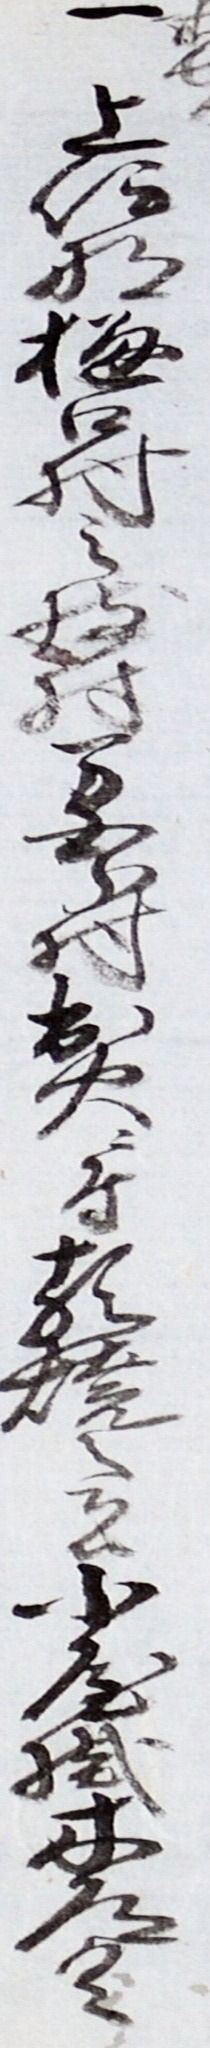一上伊那樋口村之持村万五郎村出火ニ付類焼之者は小屋掛木道具
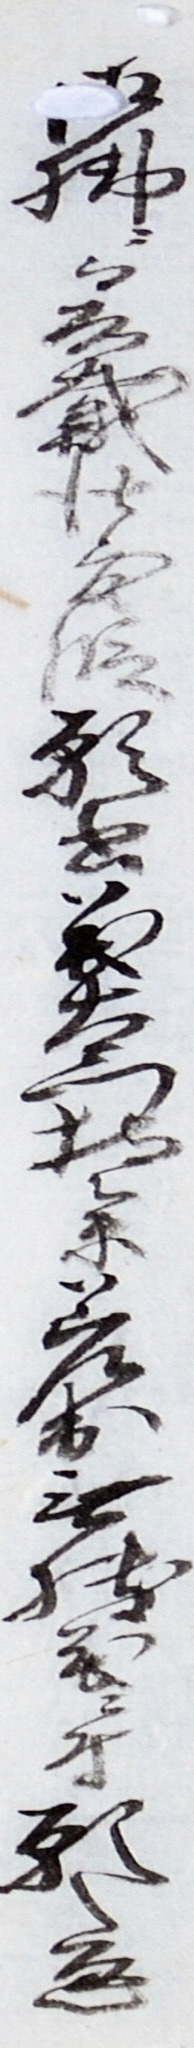御払ニ而取戴仕度段願出義右衛門持参差出無拠之義ニ付願之通
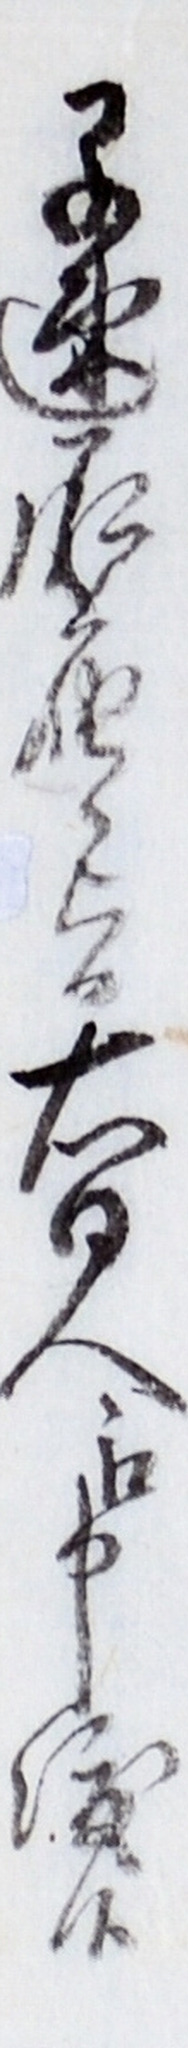早速承置之旨右同人江申渡候
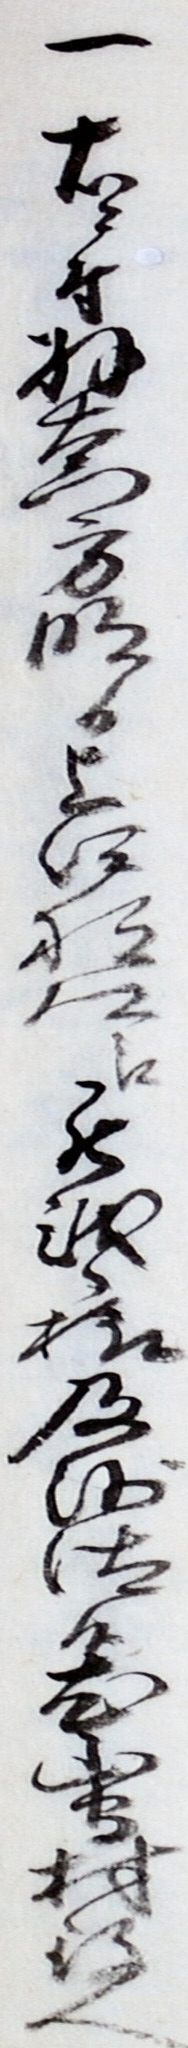一右ニ付羽右衛門方昨日上伊那郷江罷越候様及沙汰候尤山守村役人
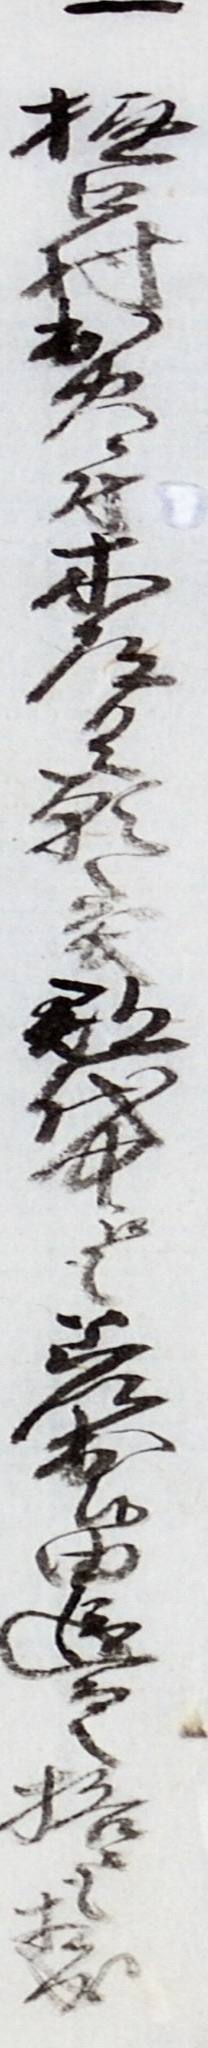一樋口村出火ニ付木道具願之義郡代中江も差出候由追而之格ニも相成
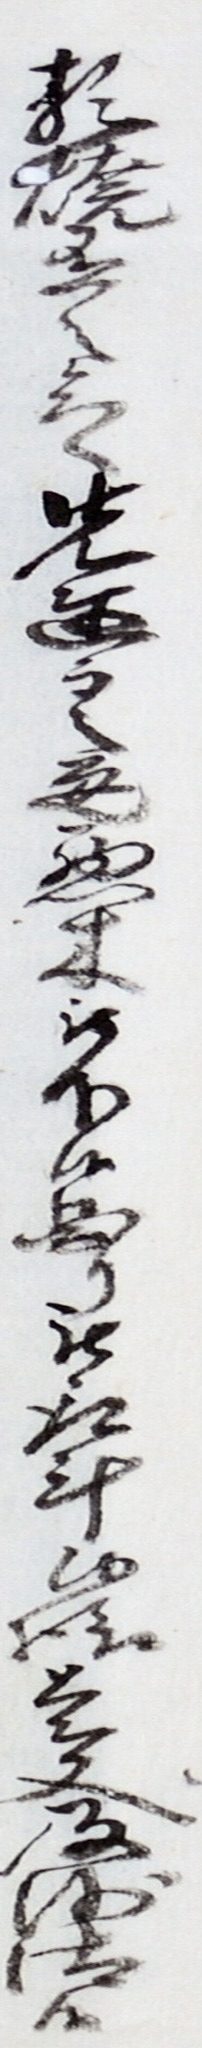一類焼有之候先達之通惣木被下候図り被取斗候様是又及沙汰候
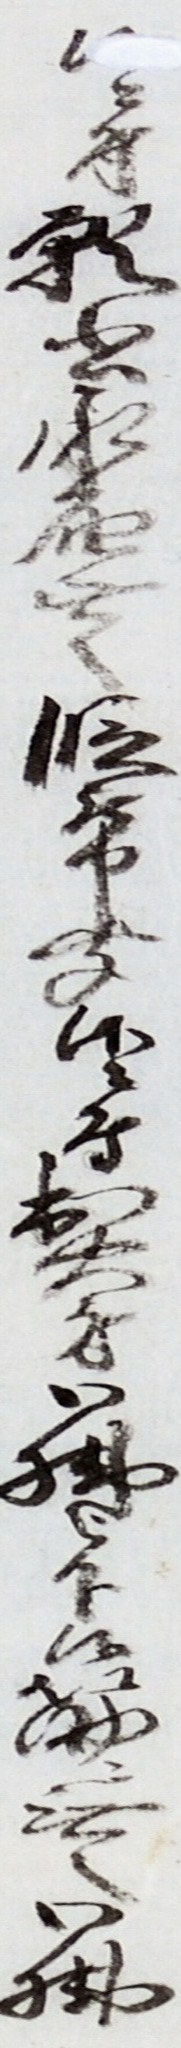ニ付願書承届無之段被申聞候ニ付出火付御払被下候筋ニ無之御払
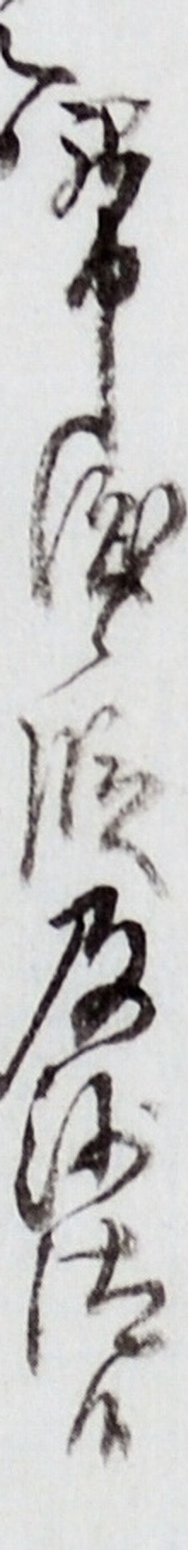就申渡候段及沙汰候
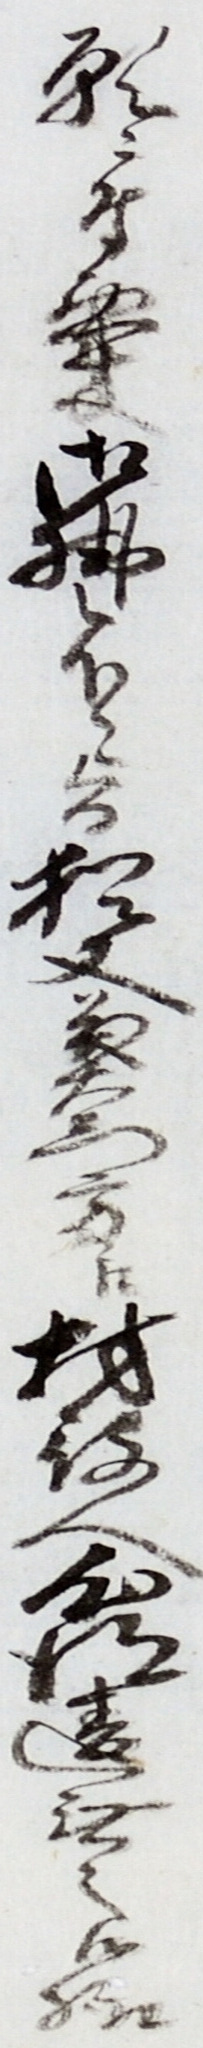願ニ付栗木御払被下候旨猶又義右衛門方江村役人心得違無之候様
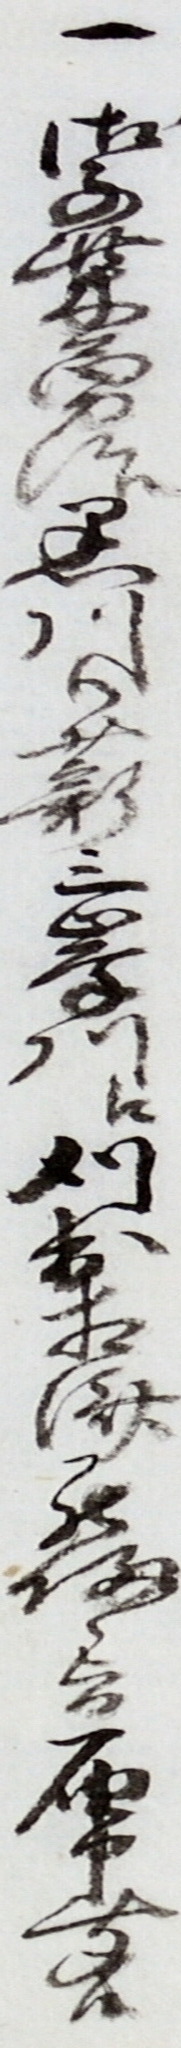一御子柴勇治黒川御薪三峯川江刈出相済罷帰候旨届申聞候
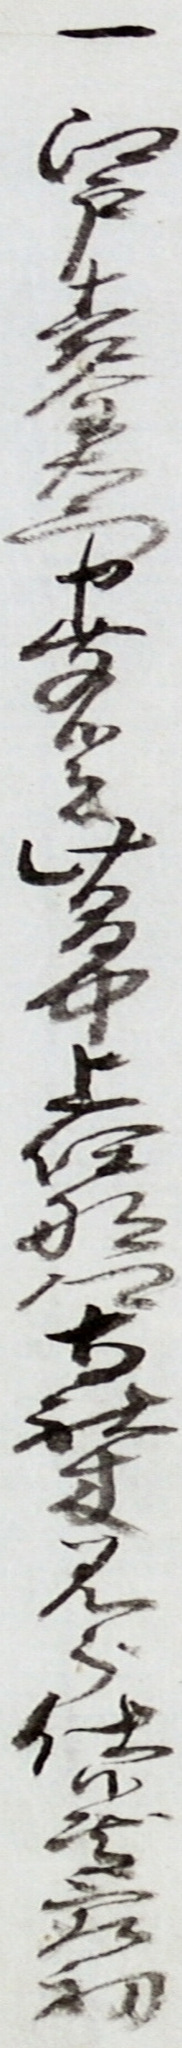一江戸表金右衛門申聞候旨此間中上伊那郷寺社木見分仕候処衆初
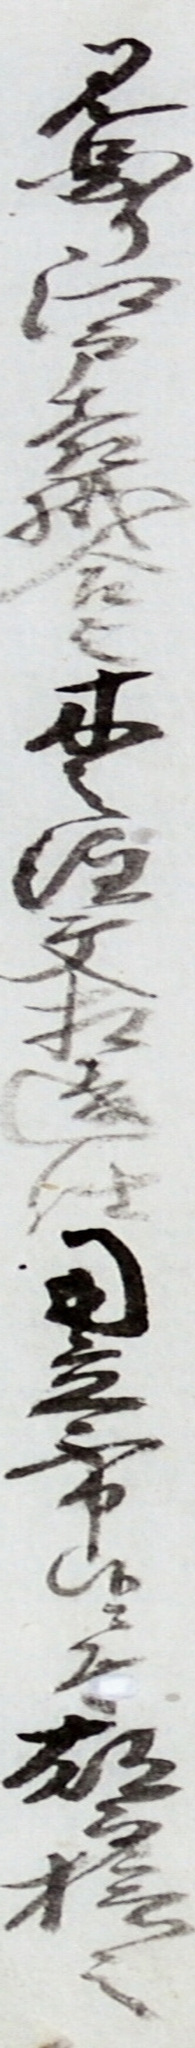見廻り江戸表掛合も木之證文相違仕用立不申候ニ付都而格之
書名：御山奉行御用控
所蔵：伊那市立高遠町図書館・合同会社AMANE
